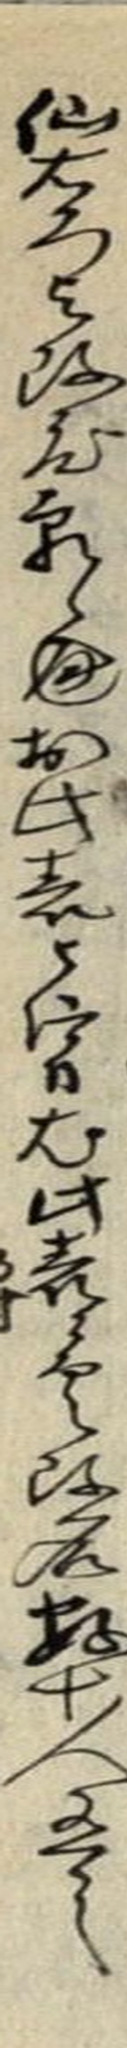仙右衛門と改度願之通於此表被仰付尤此表に而之改名数十人有之
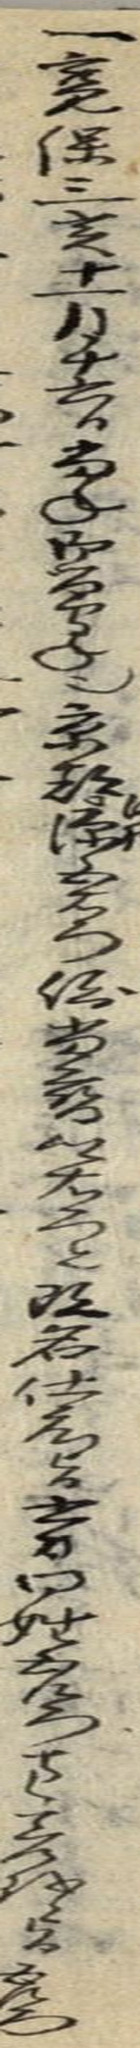一寛保三亥十一月十六日当年御留守年也京都河村源五右衛門儀当暮郷右衛門と改名仕度旨書付同姓五左衛門方へ差越候旨五左衛門
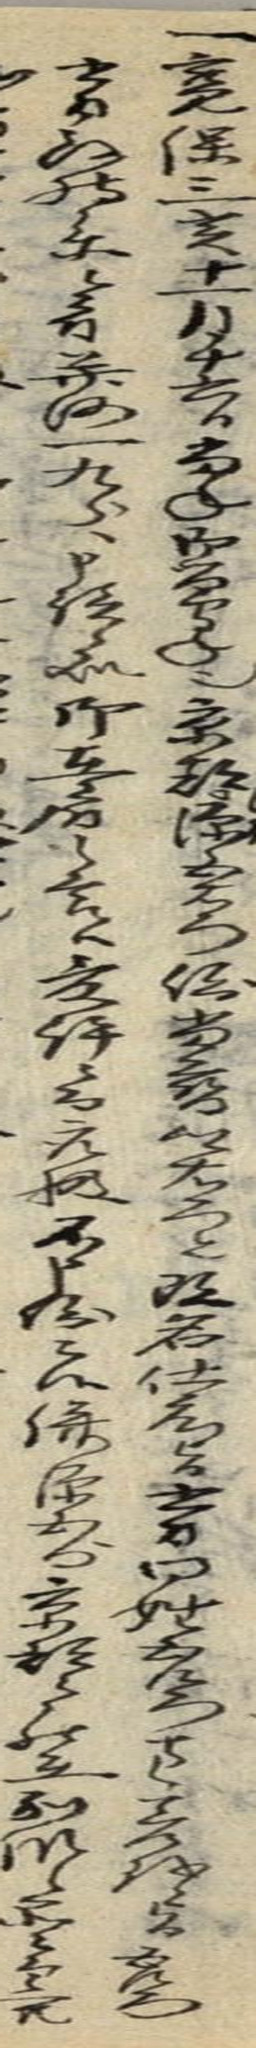書付致持参候に付並河一九郎へ申談候処御在府之節は爰許に而取扱不申儀に候併源五左衛門京都に罷在別段之品に而候へ共
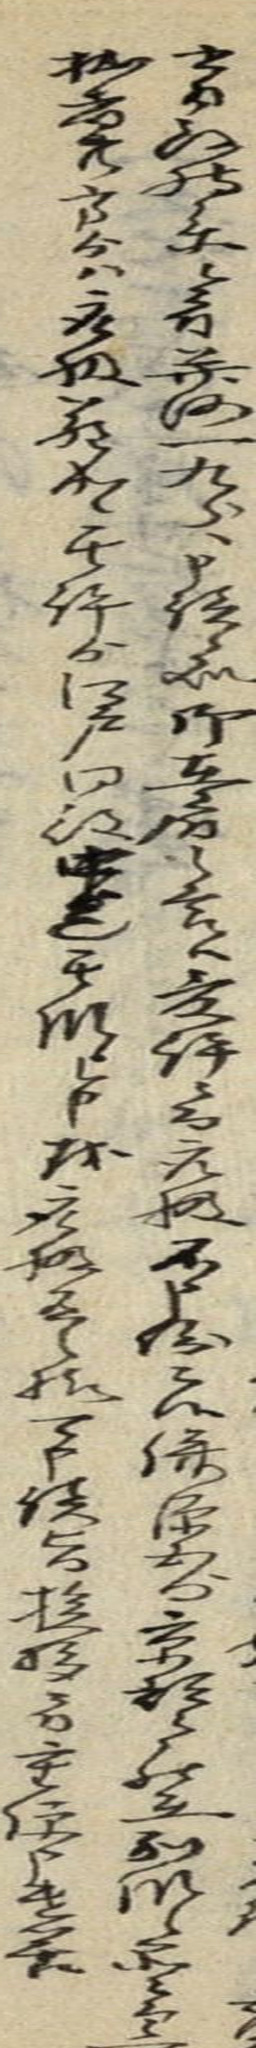拙者共方ゟは取扱難成候其許ゟ江戸同役中迄其段被申越取扱有之候様可申談之旨挨拶に付重便申遣筈
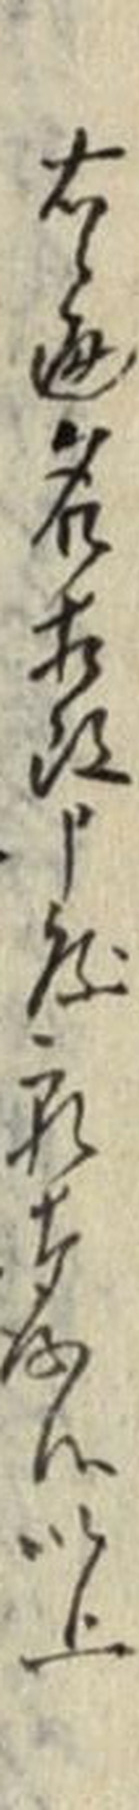右之通名相改申度願奉存候以上
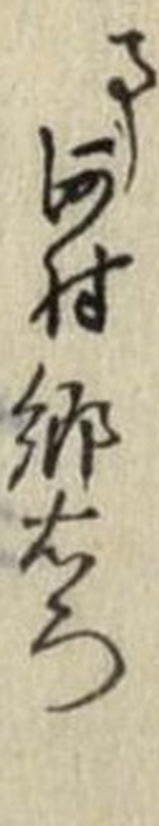河村郷右衛門
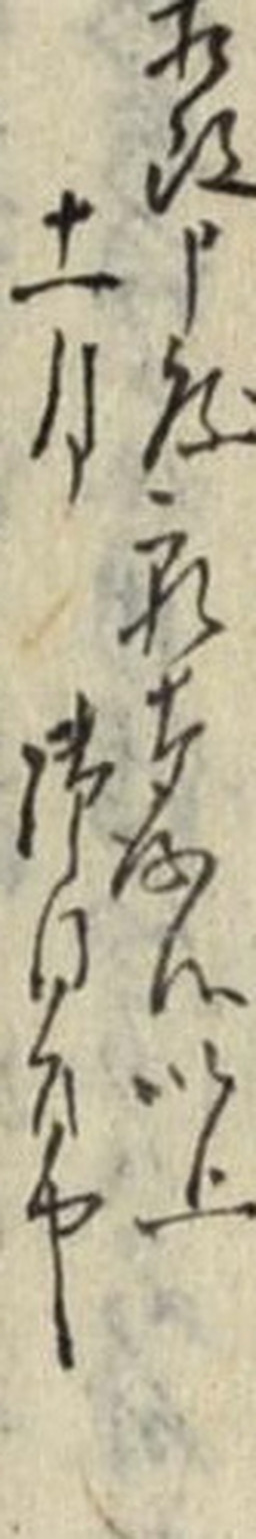十一月御目付中
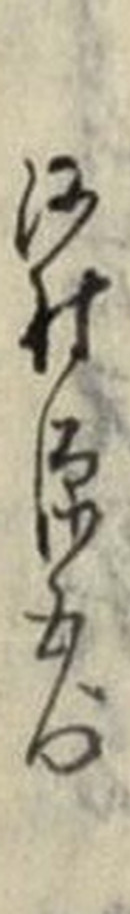河村源五右衛門
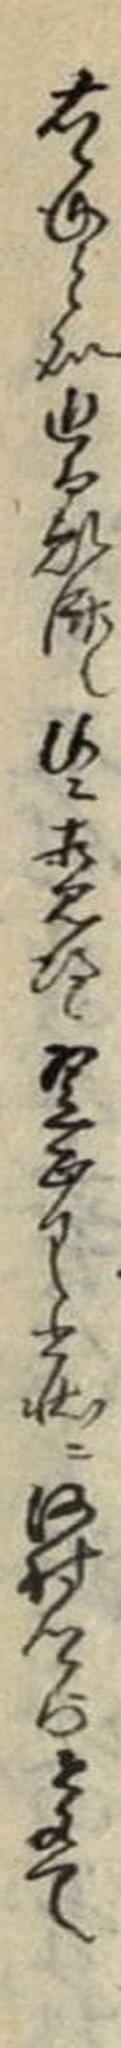右之趣に候処追而願済之趣に相見得候翌正月之書状に河村郷右衛門と有之
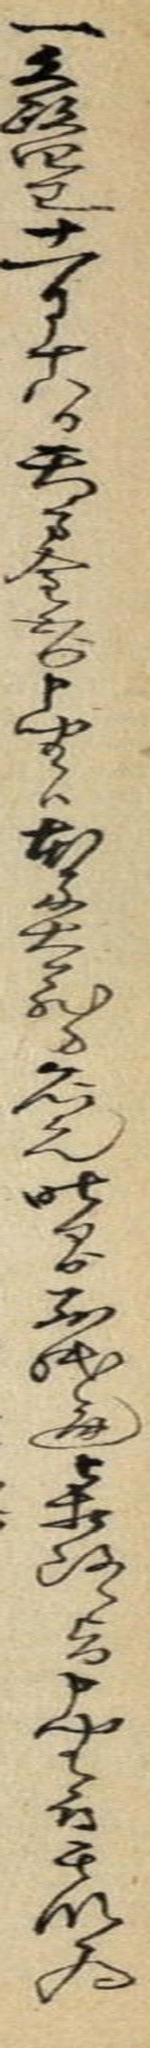一文政四巳十一月十八日天方金五右衛門申聞候は本多大蔵方名元昨日ゟ別紙之通被相改候旨申聞候に付其段為
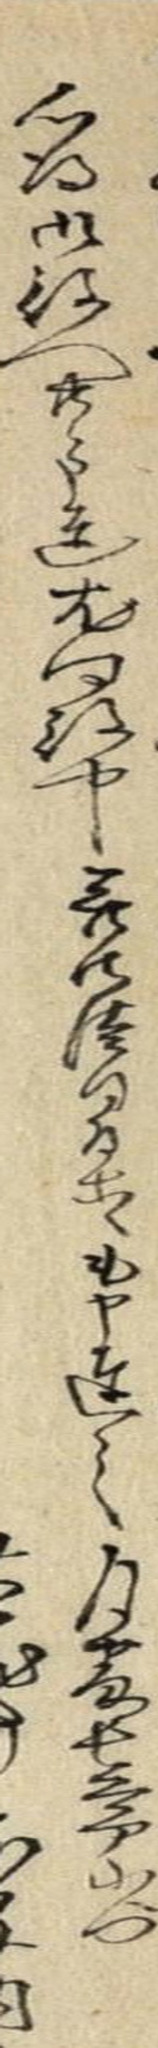心得御役人共へ申達尤同役中并御徒目付等へも申達之月番長谷部小右衛門
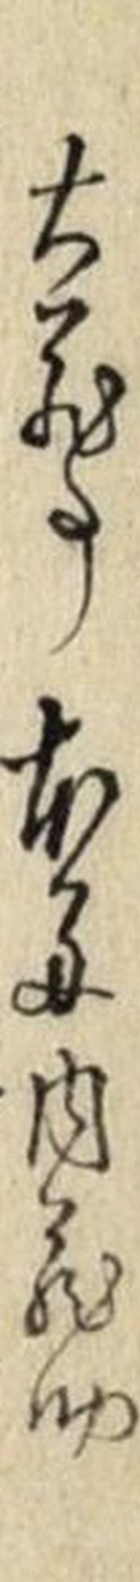大蔵事本多内蔵助
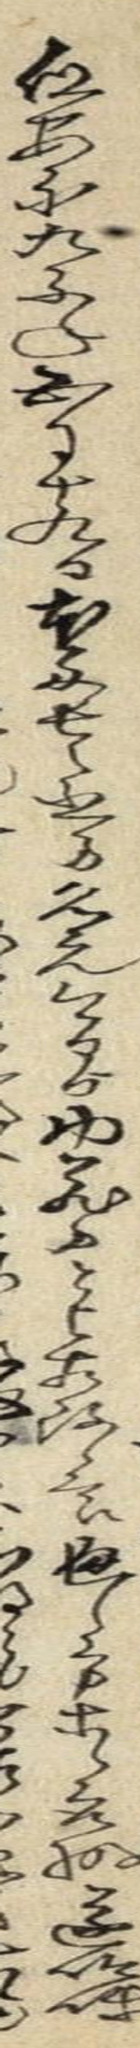但安永九子年五月十九日本多七之丞方名元今日ゟ内蔵方と被相改候節通之方等の取扱遂吟味
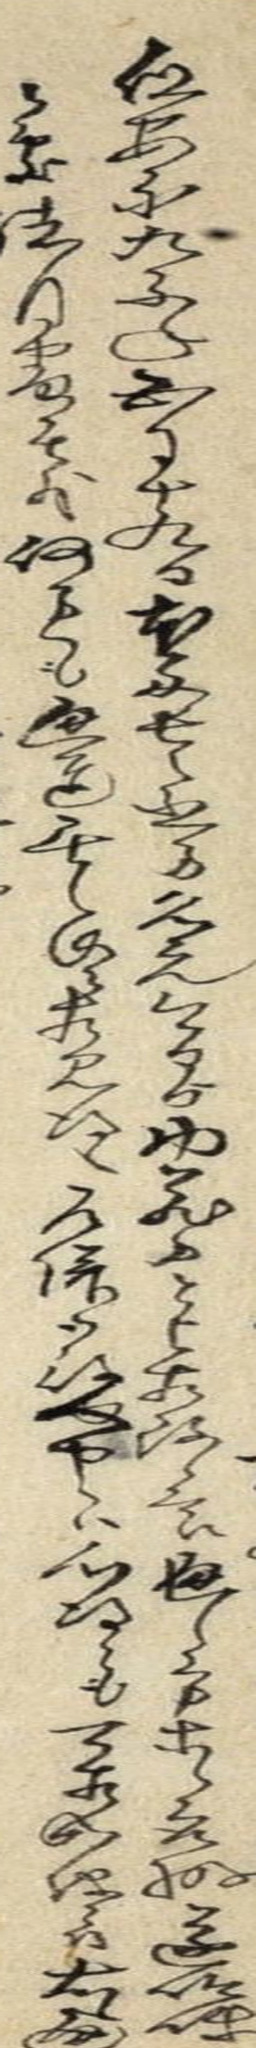候処詰月番其外何方へも通達無之候趣に相見得候乍併御役人中へは心得にも可相成儀に付右之通
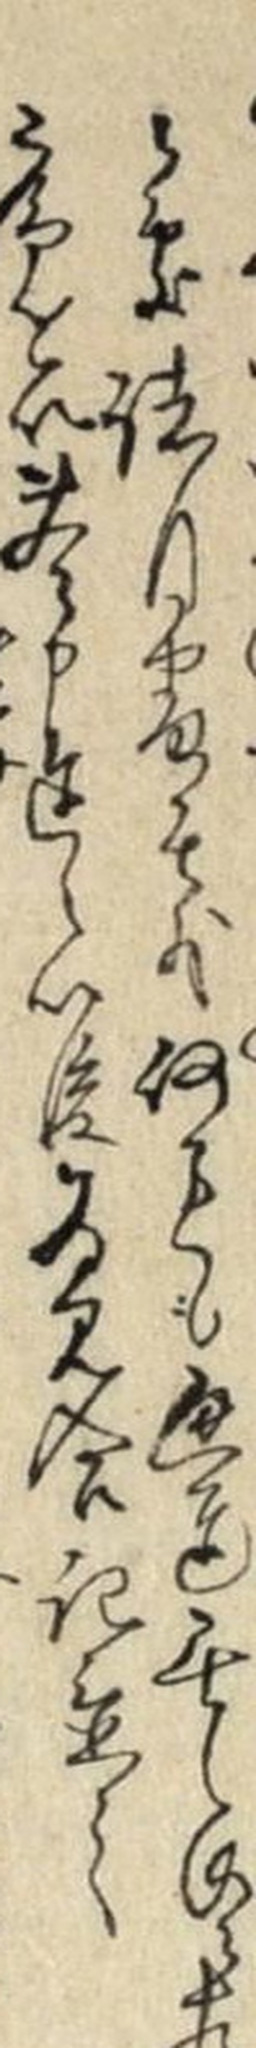序を以夫々申達之以後為見合記置之
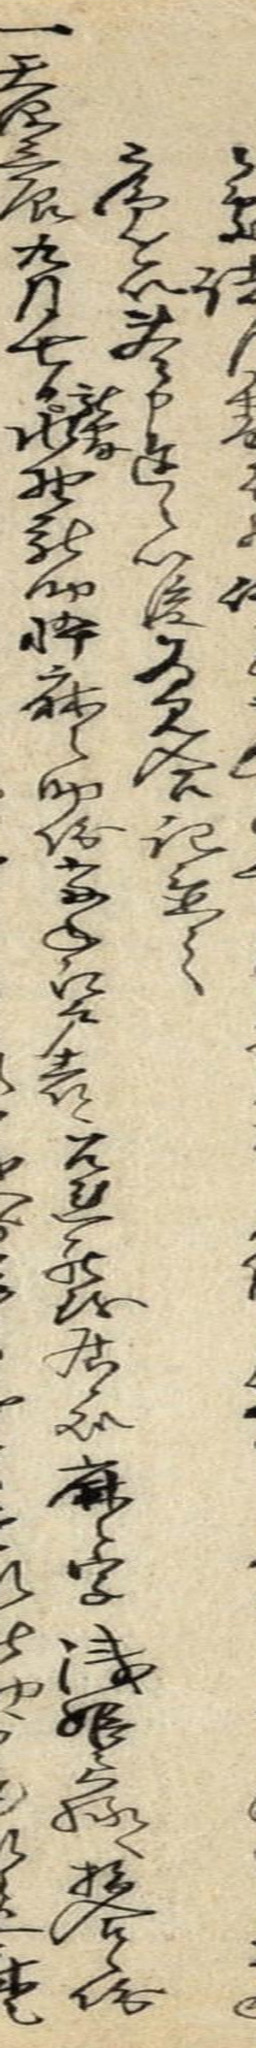一天保三辰九月七日新番水野新助忰麻之助儀当年江戸表へ召連罷越居候処麻之字浅姫君様へ指合候儀
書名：蒐輯之部
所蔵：福井県文書館 Fukui Prefectural Archives
